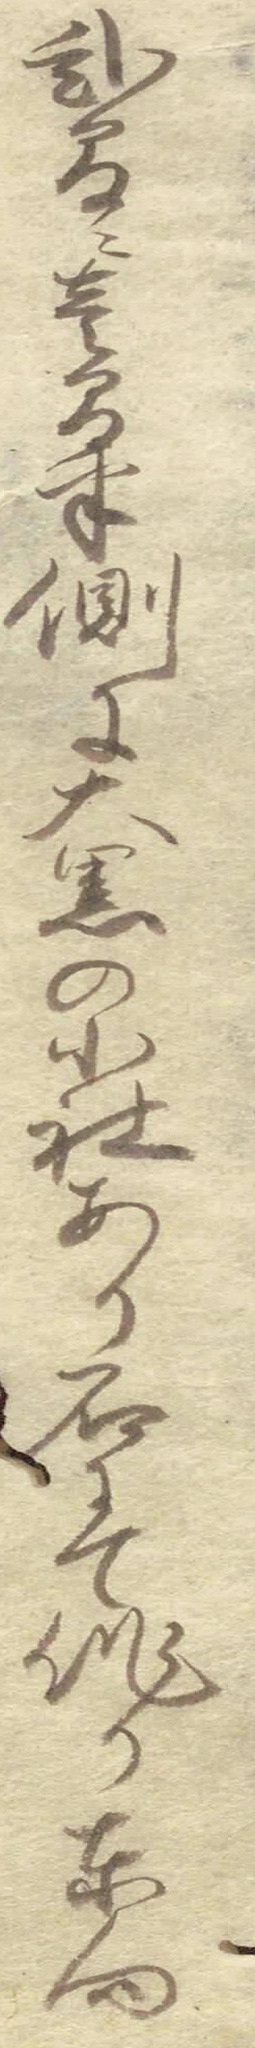弐間に壱間半側に大黒の小社あり石にて作り東向
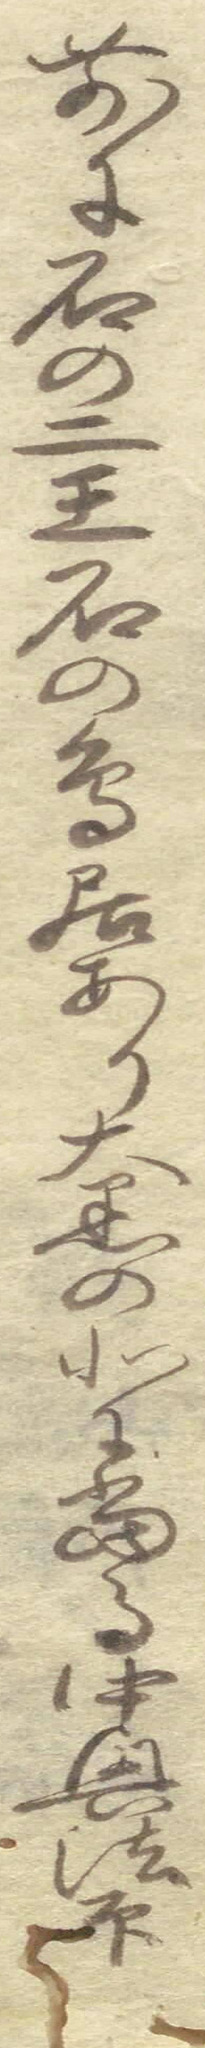前に石の二王石の鳥居あり大黒の北に当寺中興法印
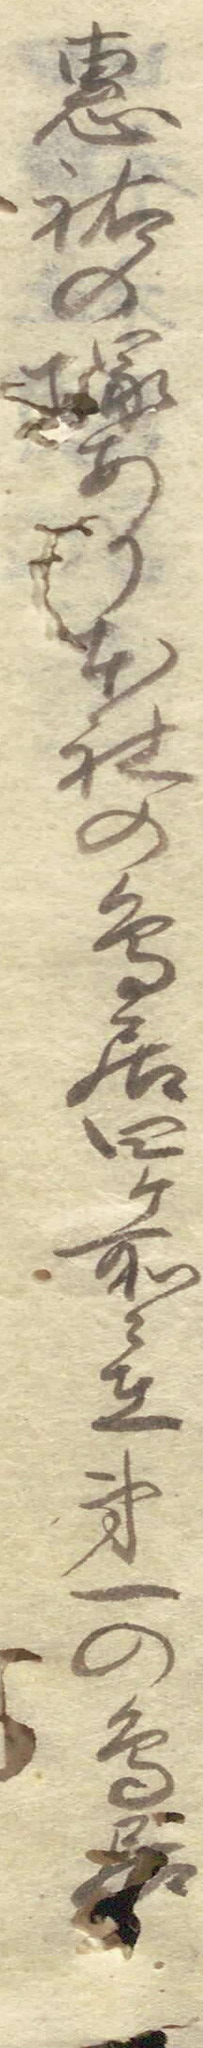恵祐の束あり本社の鳥居四ヶ所に在第一の鳥居
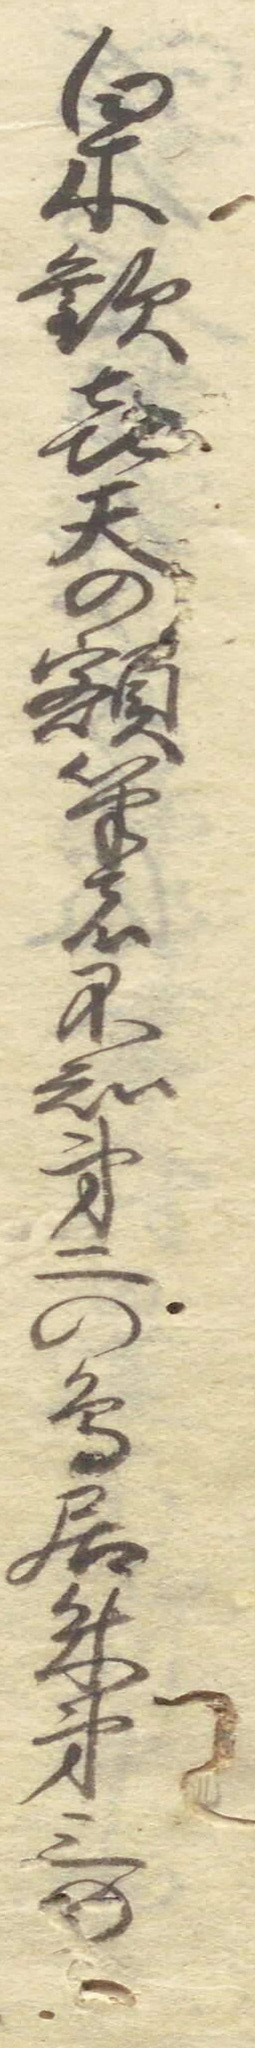白木歓喜天の額筆者不知第二の鳥居朱第三の
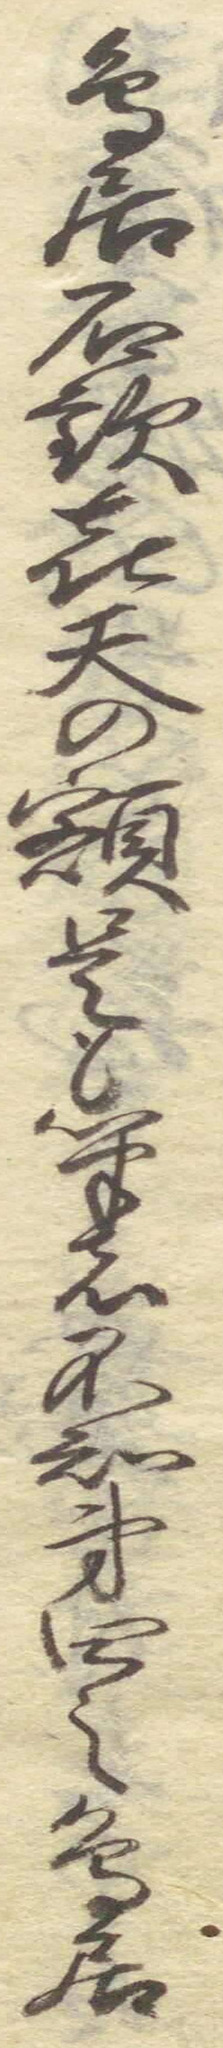鳥居石歓喜天の額是も筆者不知第四之鳥居
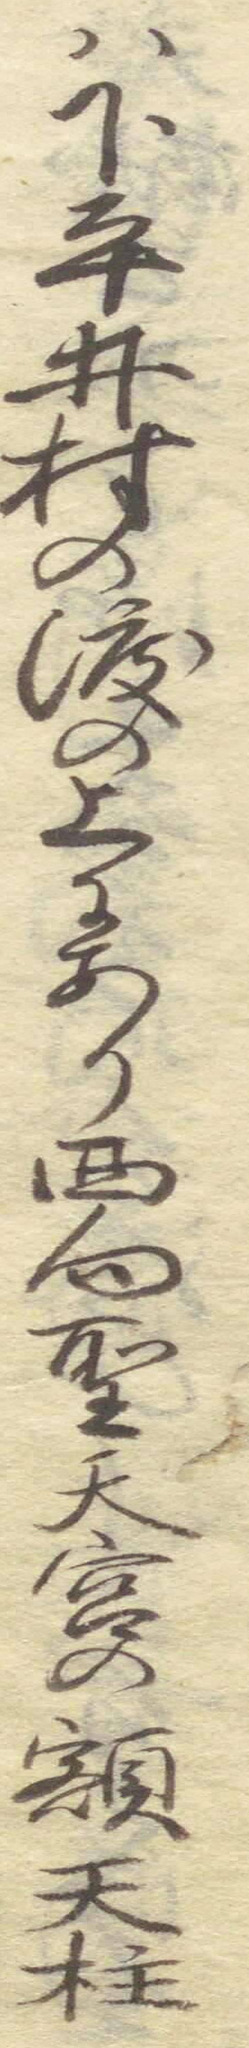は下平井村の渡の上にあり西向聖天宮の額天柱
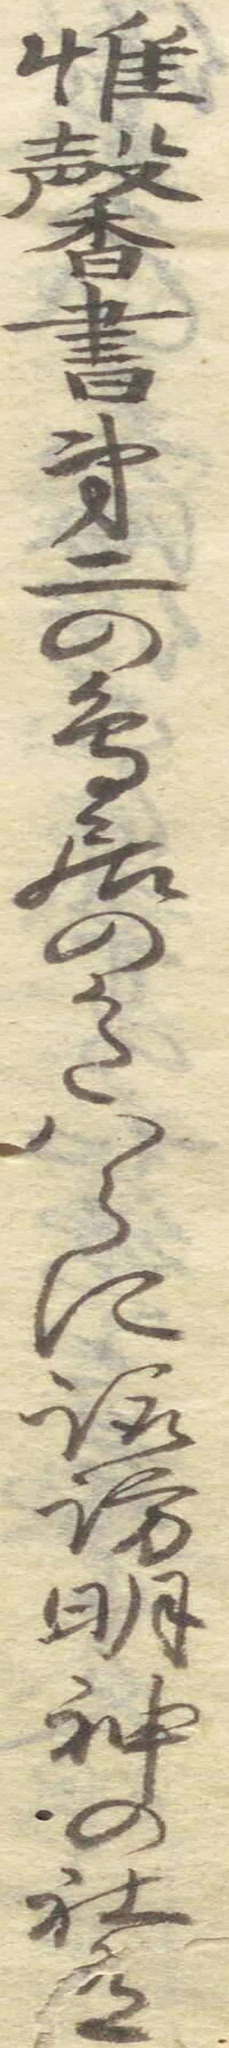惟馨書第二の鳥居のかたはらに諏訪明神の社有
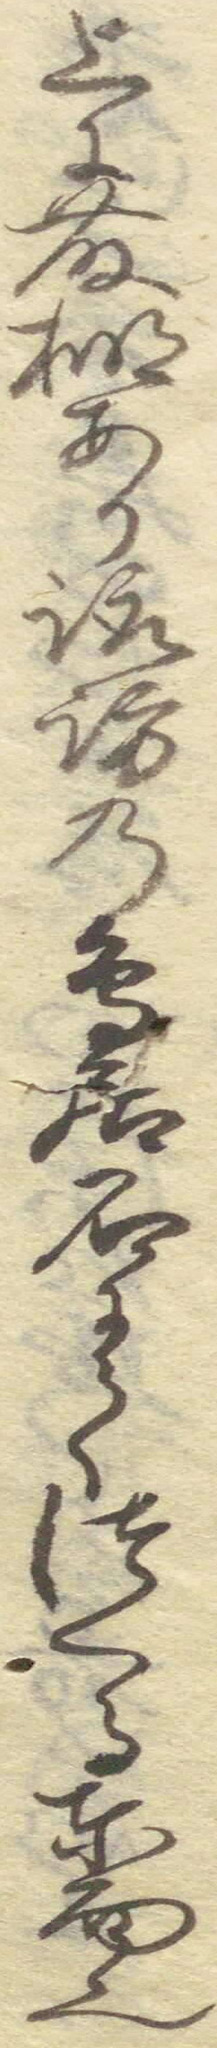上に藤棚あり諏訪の鳥居石にてつくる東面也
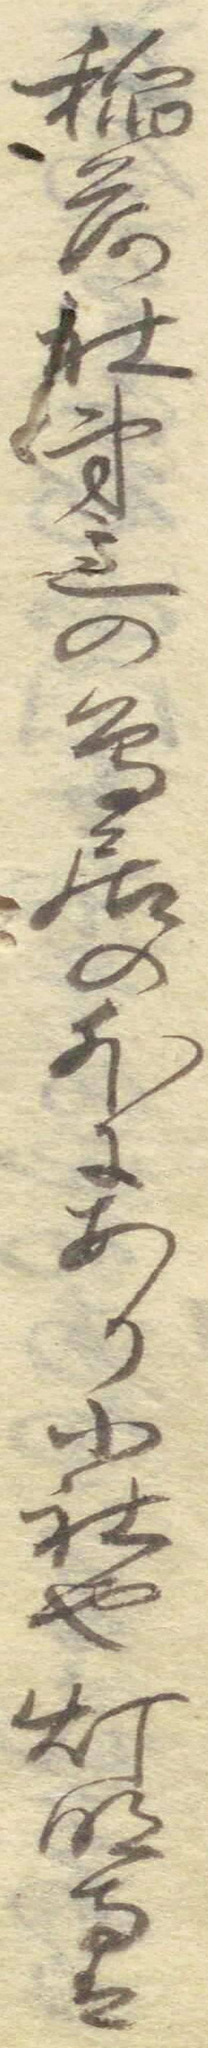稲荷社第三の鳥居の外にあり小社也灯明寺は
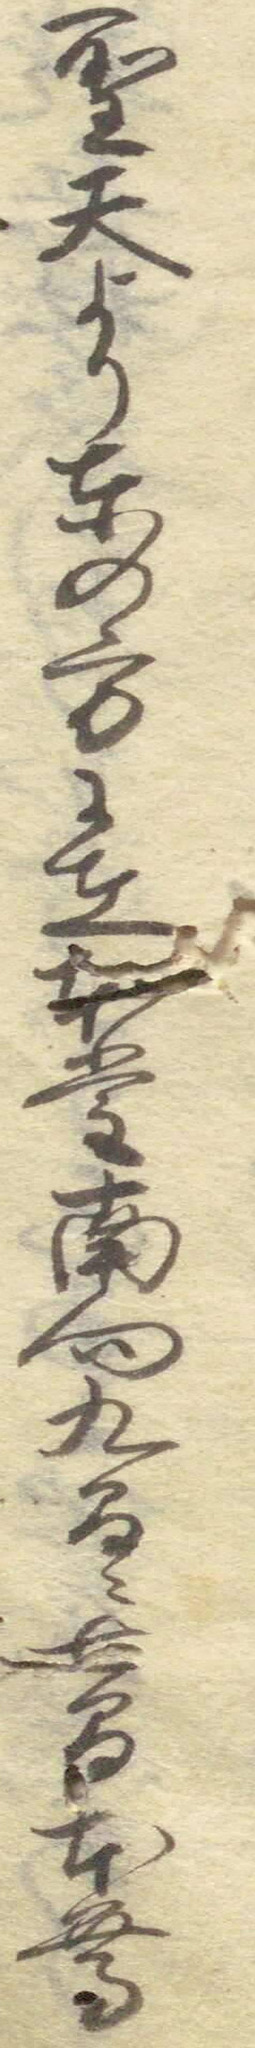聖天より東の方に在る本堂南向九間七間本尊
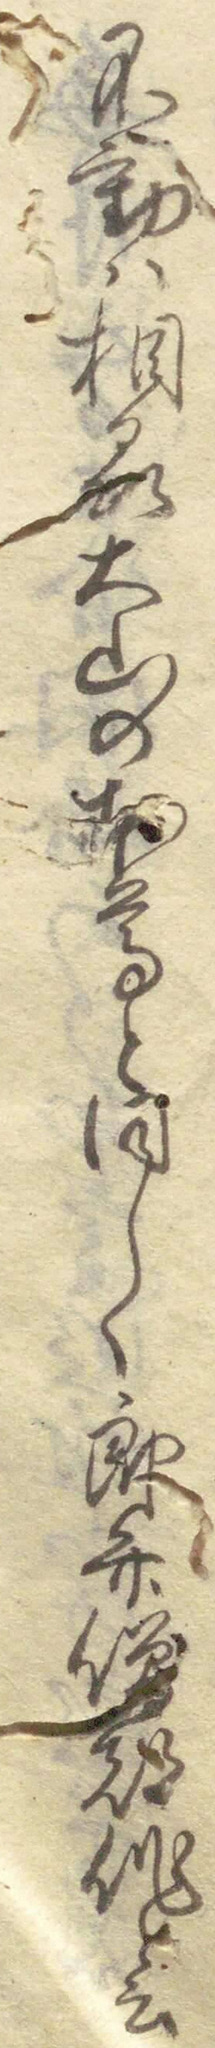不動は相州大山の本尊と同しく郎弁僧都作と云

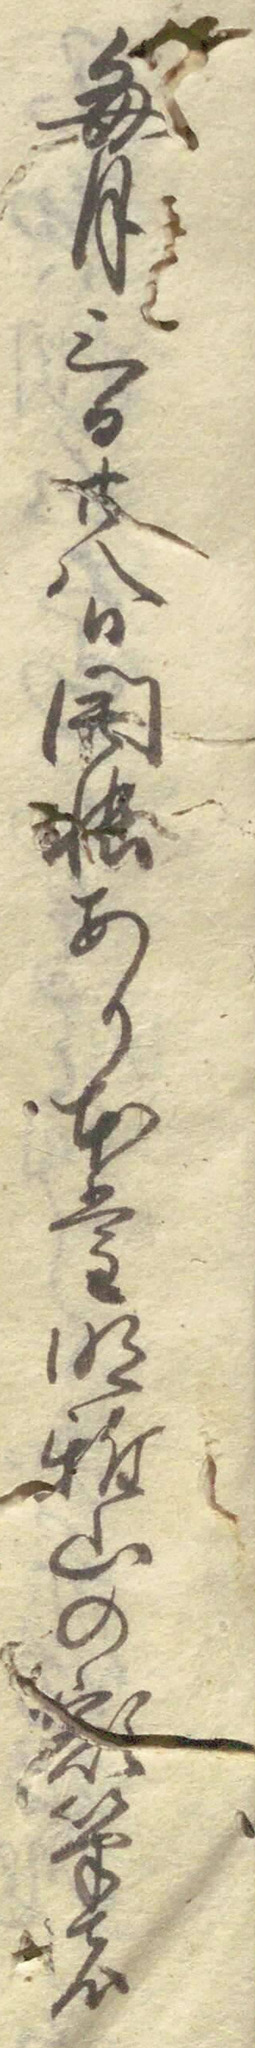毎月三日廿八日開帳あり本堂明雅山の額筆は
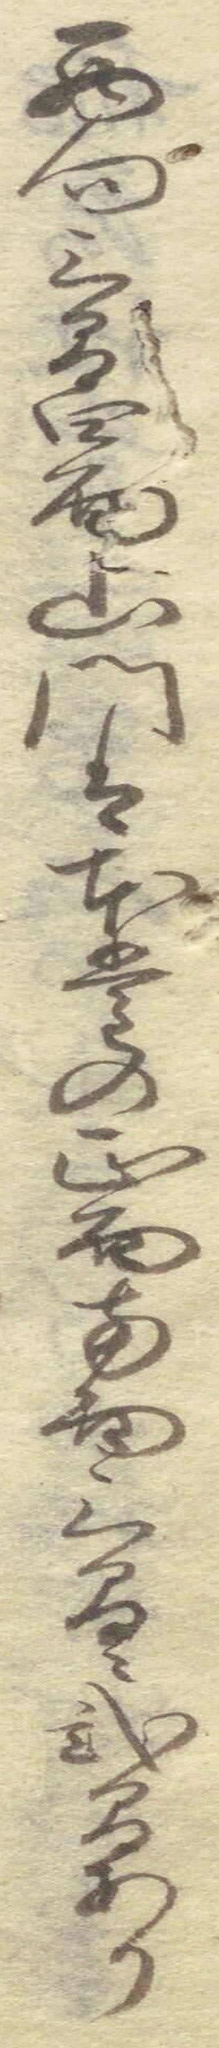西向三間四面山門は本堂の正面南面三間に弐間あり
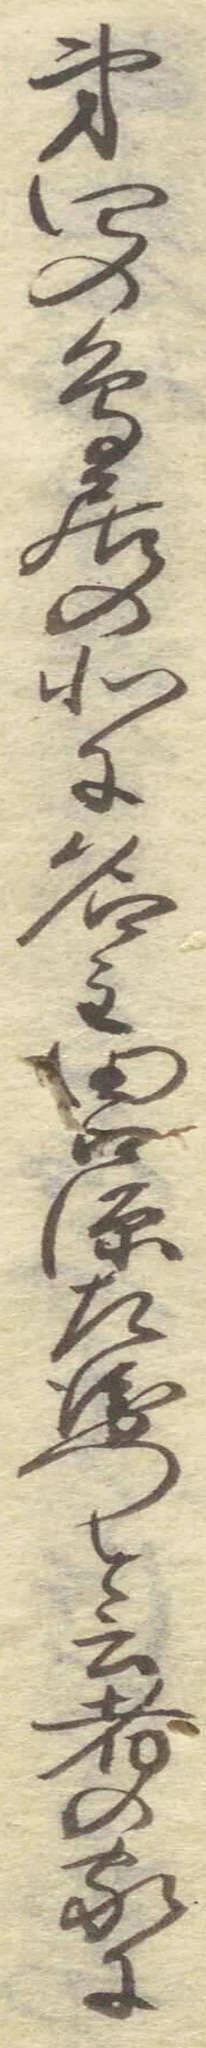第四の鳥居の北に名主田口源左衛門と云者の家に
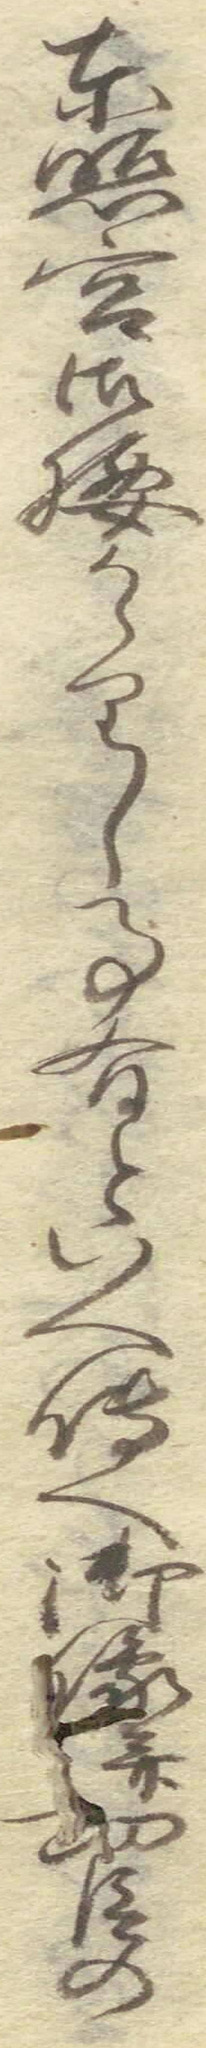東照宮御腰かゝりし事有といへ伝へ御像并功臣の
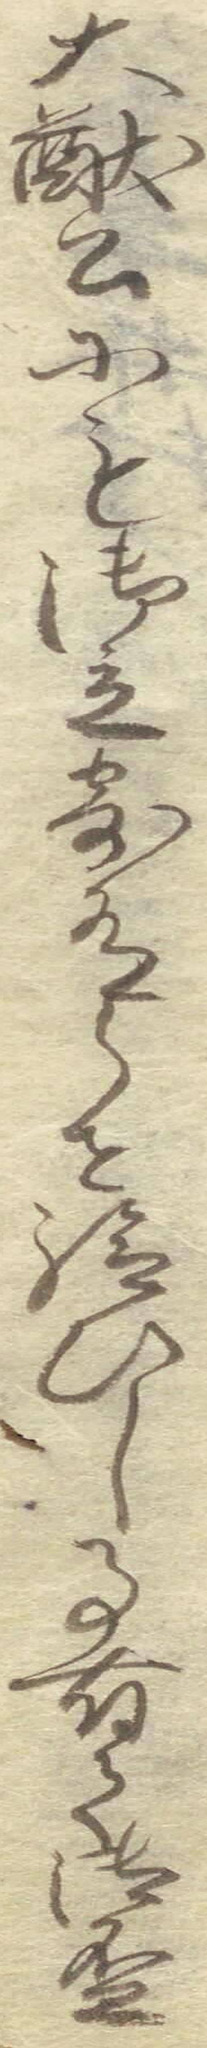大猷公にも御立寄有らせ給ひし事有て御盃
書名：四神社閣記
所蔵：茨城大学附属図書館 国文学研究資料館
